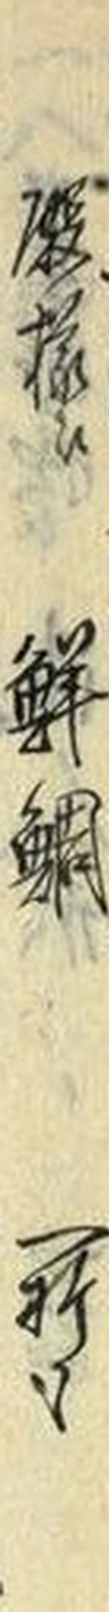殿様江鮮鯛一折ツゝ
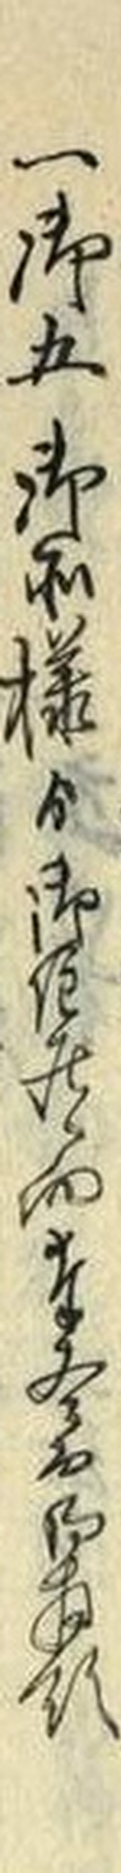一御五御所様ゟ御住居向奉文ニ而御拝領
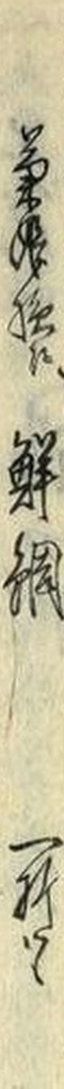菊姫様江鮮鯛一折ツゝ
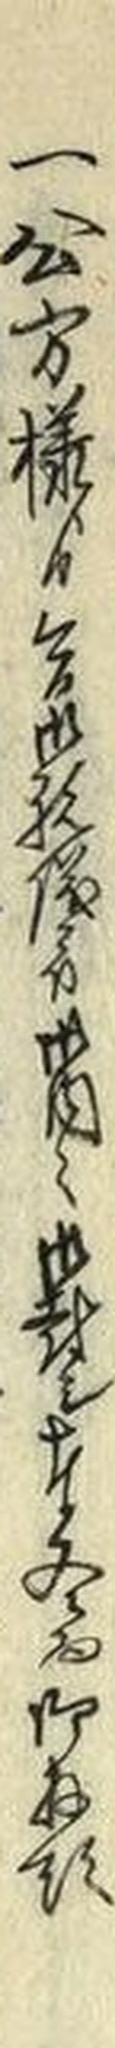一公方様ゟ今日御祝儀ニ付御内々御封シ奉文ニ而御拝領
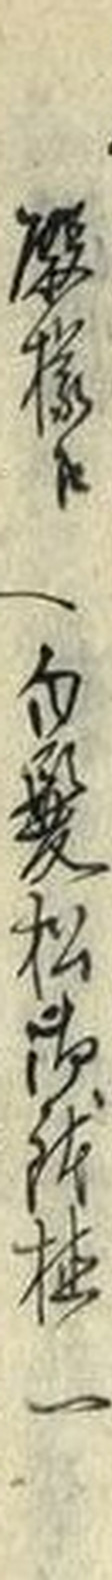殿様江白髪松御鉢植一
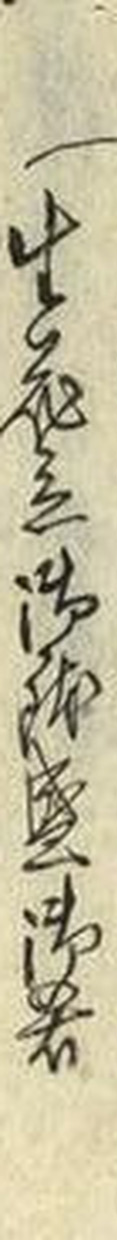生花立御鉢盛御肴
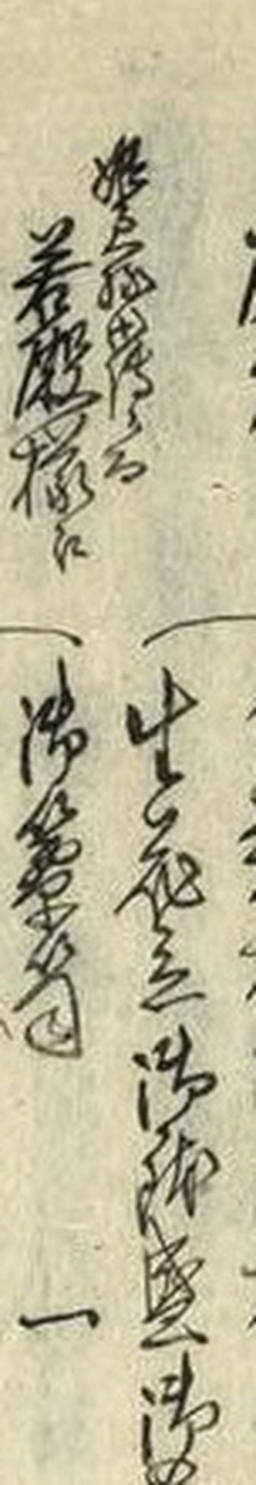若殿様江御箪笥一
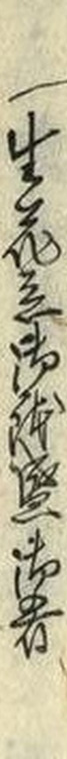生花立御鉢盛御肴
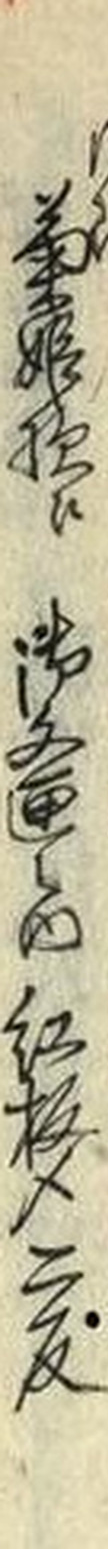菊姫様江御文匣之内紅板〆二反
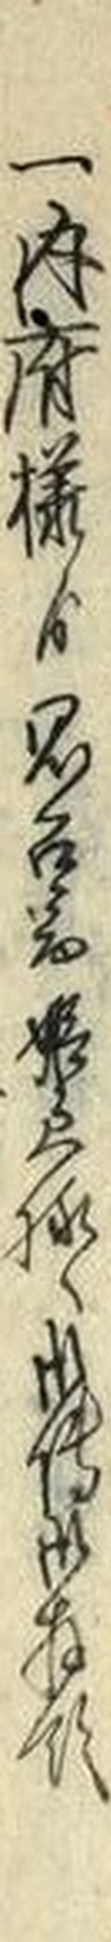一内府様ゟ思召ニ而姫君様へ御伝御拝領
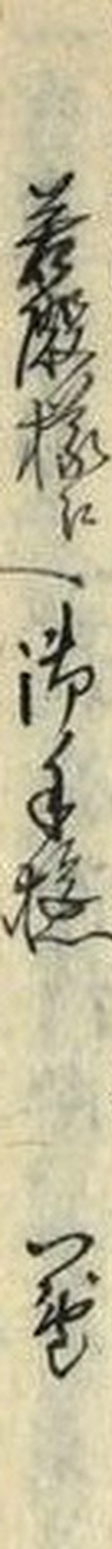若殿様江御手遊一台
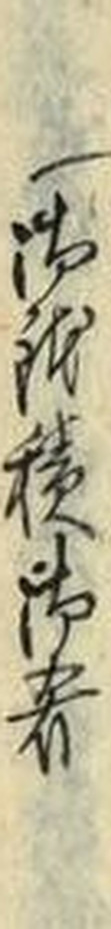御鉢積御肴

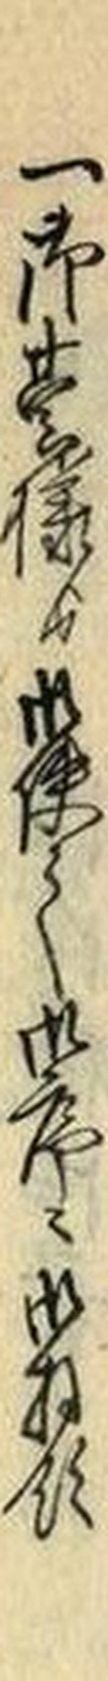一御台様ゟ御使之序ニ御拝領
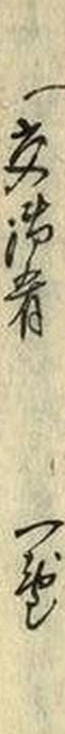交御肴一台
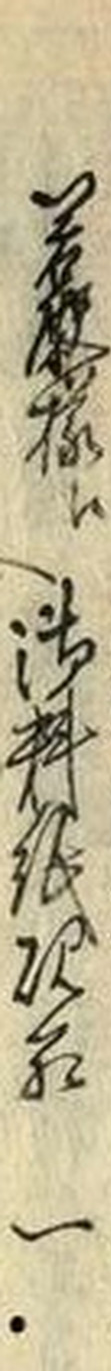若殿様江御料紙硯箱一
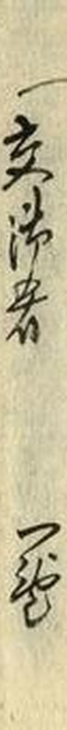交御肴一台
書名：少傅日録抄（斉承付側向頭取日記、在府）
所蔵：福井県文書館 Fukui Prefectural Archives
